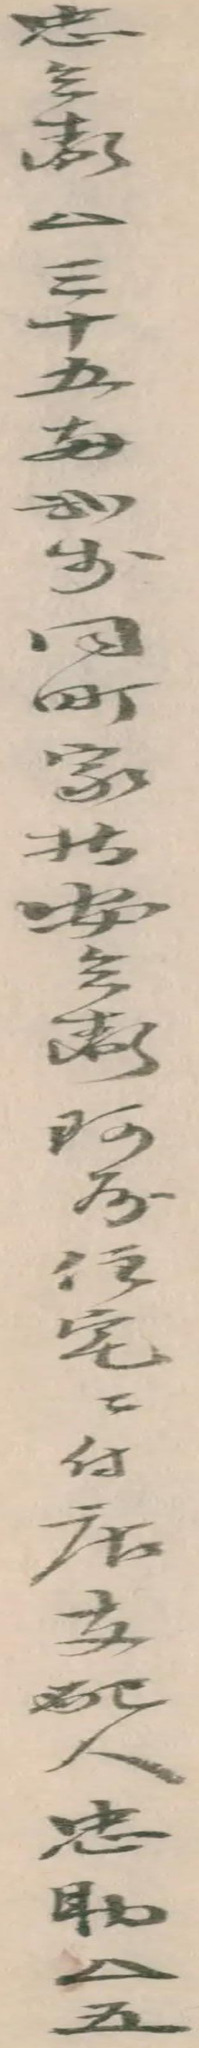忠兵衛△三十五両弐歩同町家持安兵衛阿州住宅付店支配人忠助△五
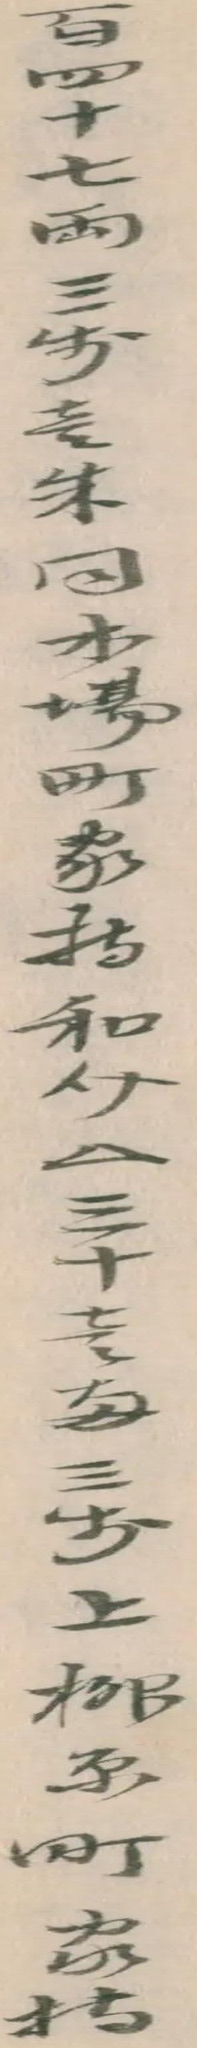百四十七両三歩壱朱同木場町家持和介△三十壱両三歩上柳原町家持
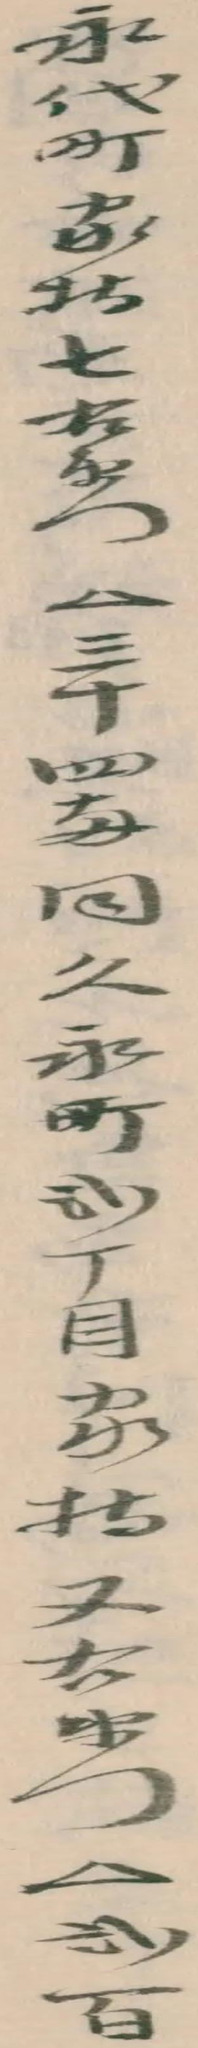永代町家持七右衛門△三十四両同久永町弐丁目家持又右衛門△弐百
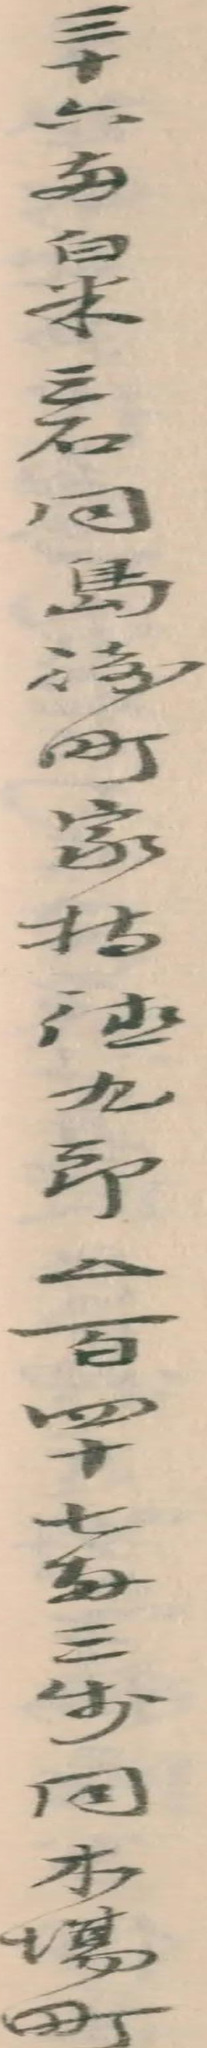三十六両白米三石同島崎町家持徳九郎△百四十七両三歩同木場町
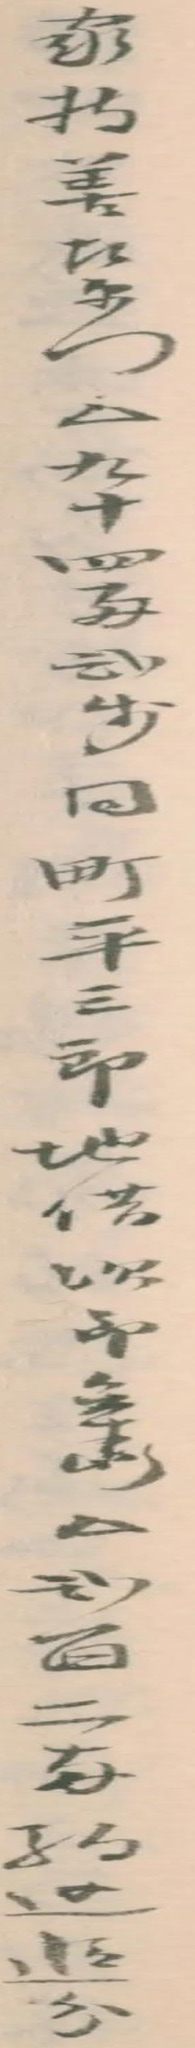家持善左衛門九十四両弐歩同町平三郎地借次郎兵衛△弐百弐両駒込追分
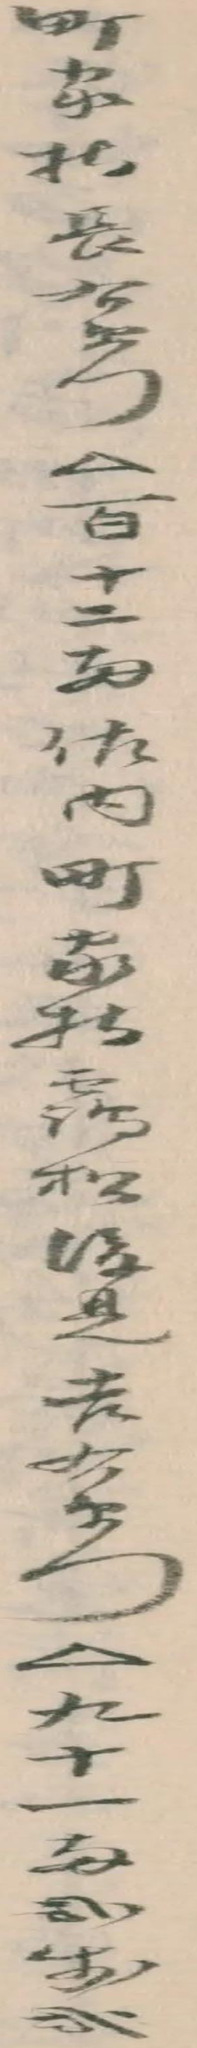町家持長右衛門△百十二両佐内町家持鶴松後見吉右衛門△九十一両弐歩弐
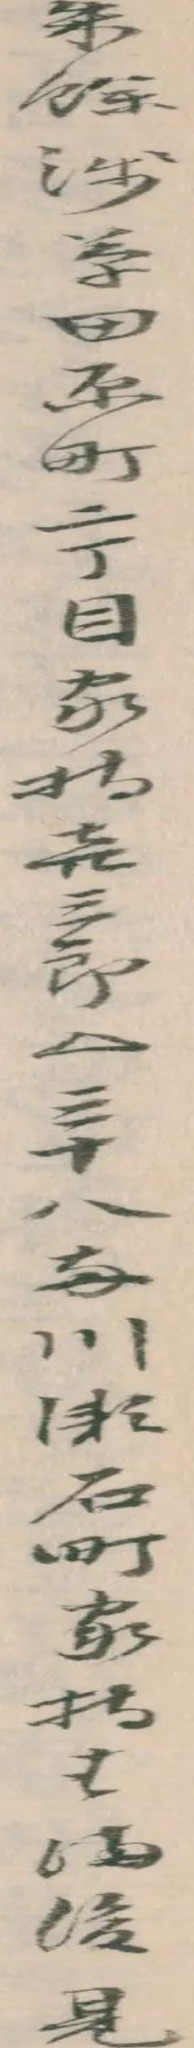朱余浅草田原町二丁目家持喜三郎△三十八両川瀬石町家持はま後見
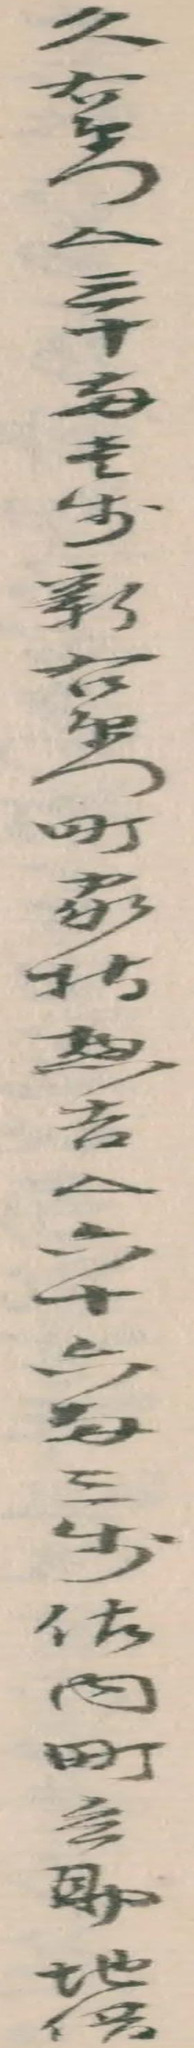久右衛門△三十両壱歩新右衛門町家持惣吉△六十六両三歩佐内町兵助地借
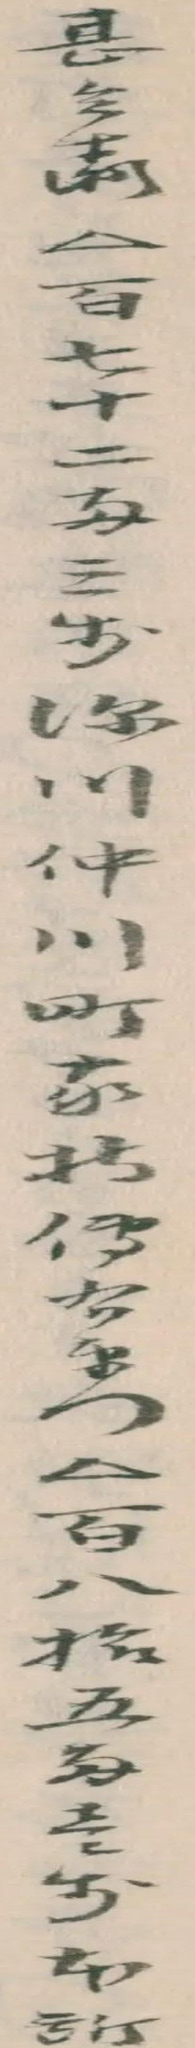甚兵衛△百七十二両三歩深川仲川町家持伝右衛門△百八拾五両壱歩本所
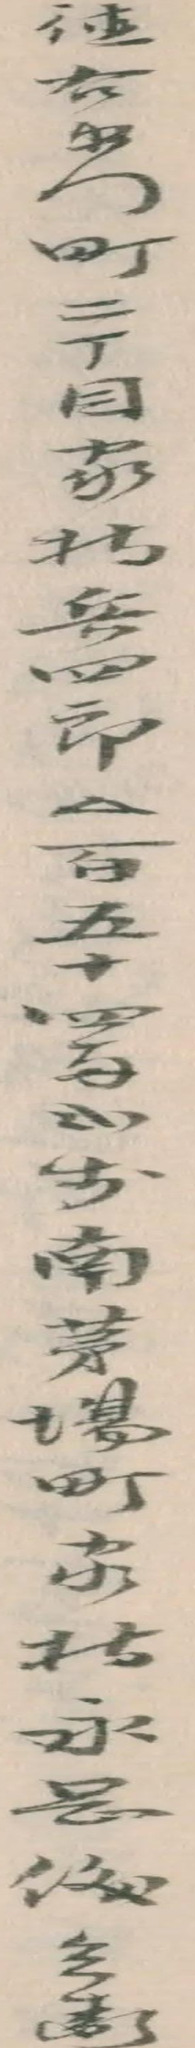徳右衛門町二丁目家持兵四郎△百五十四両弐歩南茅場町家持永岡儀兵衛
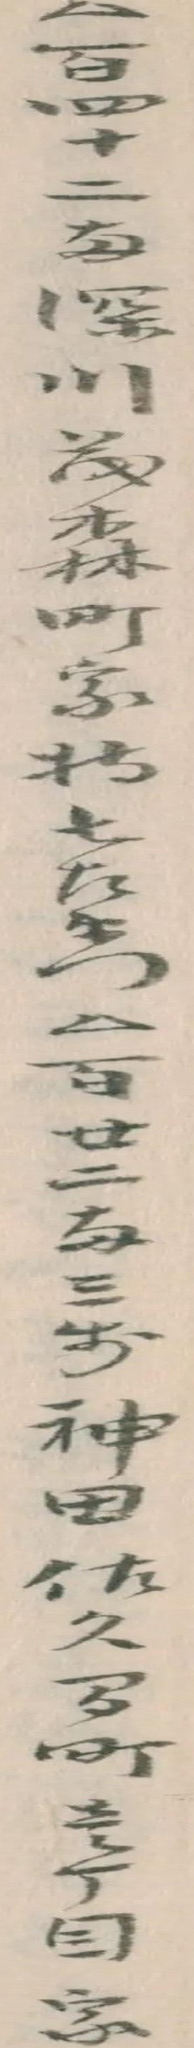△百四十二両深川茂森町家持七左衛門△百廿二両三歩神田佐久間町壱丁目家
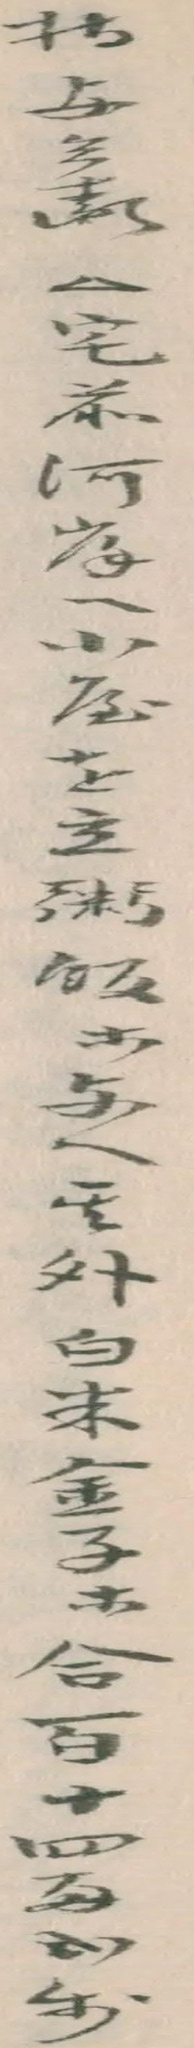持与兵衛△宅前河岸へ小屋を立粥飯等与へ其外白米金子等合百十四両弐歩
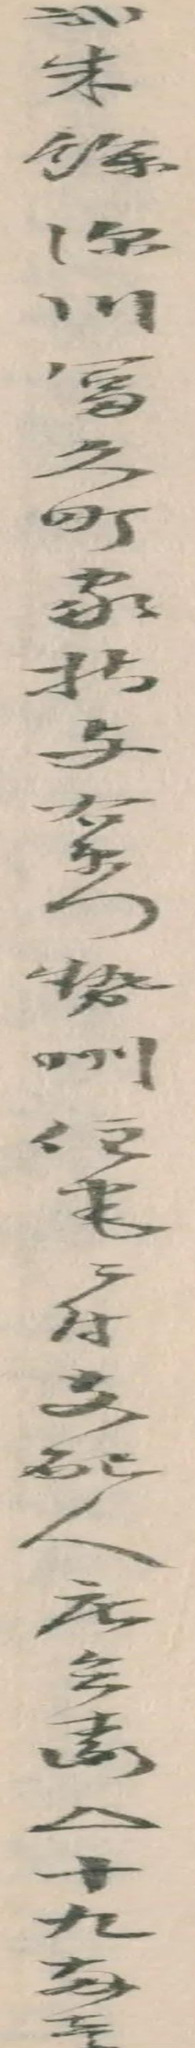弐朱余深川冨久町家持与右衛門勢州住宅付支配人庄兵衛△十九両壱
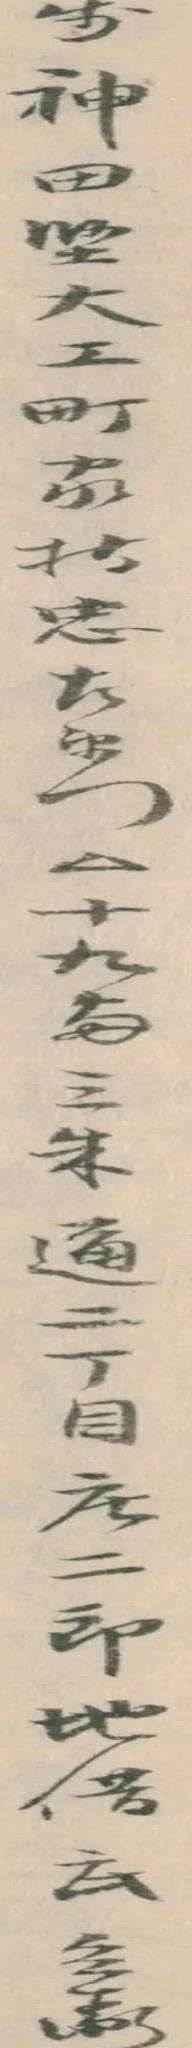歩神田堅大工町家持忠左衛門△十九両三朱通二丁目庄二郎地借武兵衛

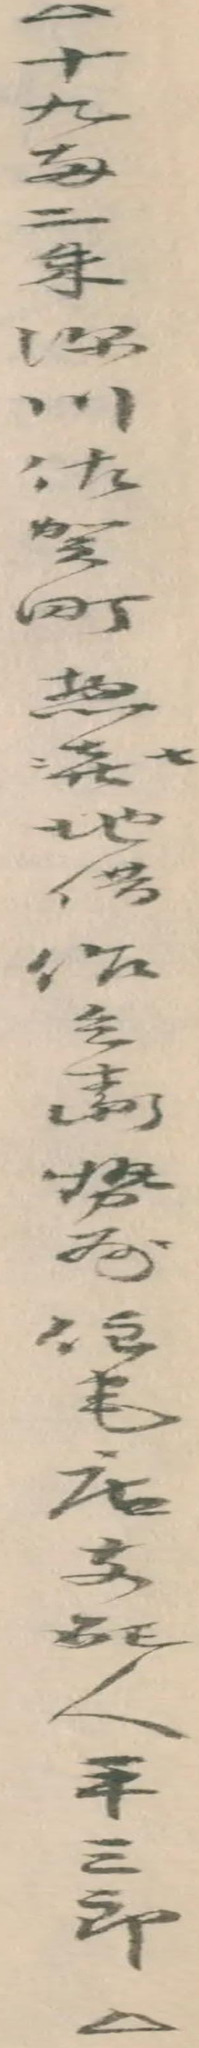△十九両二朱深川佐賀町惣喜地借作兵衛勢州住宅店支配人平三郎△
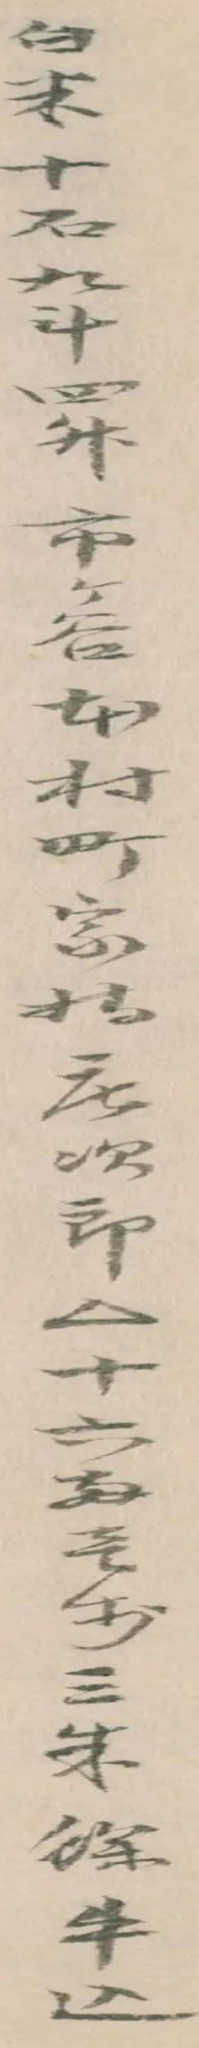白米十石九斗四升市ヶ谷本村町家持庄次郎△十六両壱歩三朱余牛込
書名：地災撮要. 巻10(地震之部) 上,下
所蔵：国立国会図書館 National Diet Library, JAPAN
